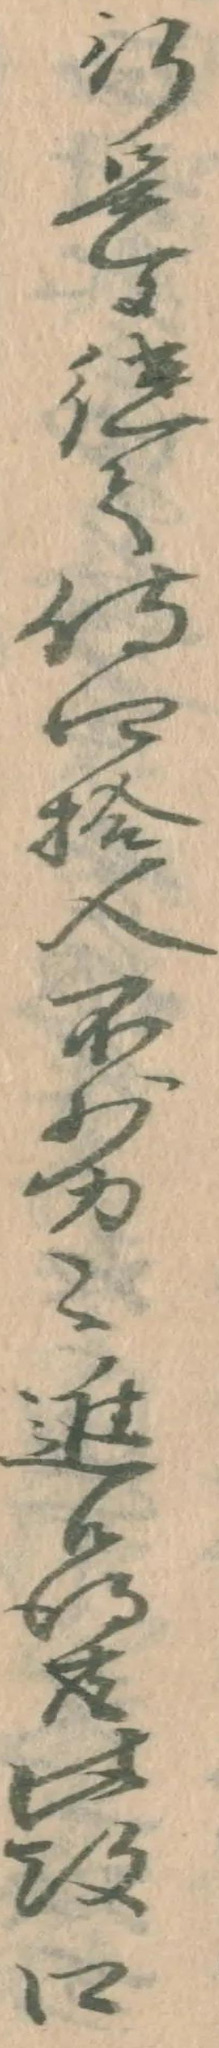行是尓継て侍四拾人不劣々進候得共此攻口
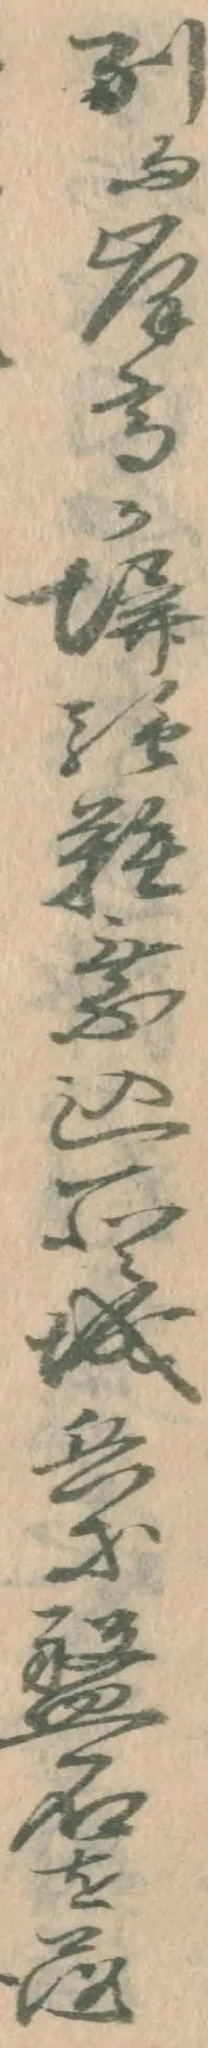別而岸高か塀強難乗込所城兵等盤石を落
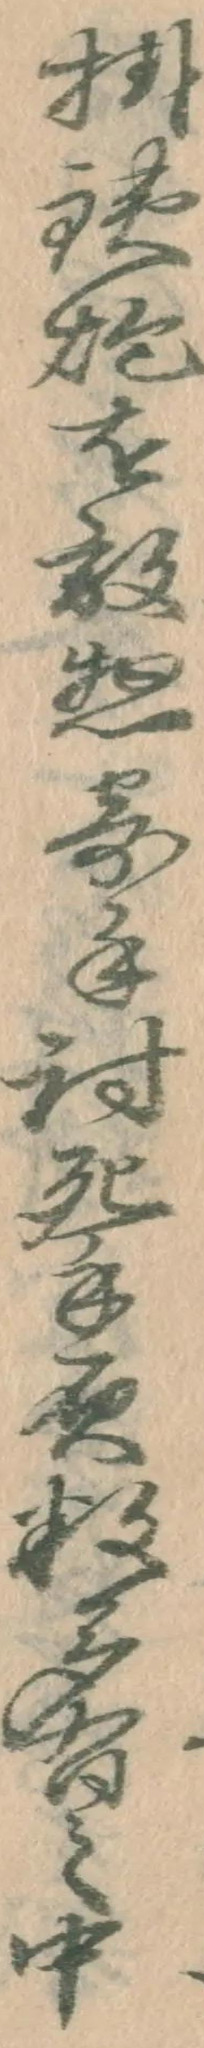掛鉄炮を放惣寄手討死手負数多有之中
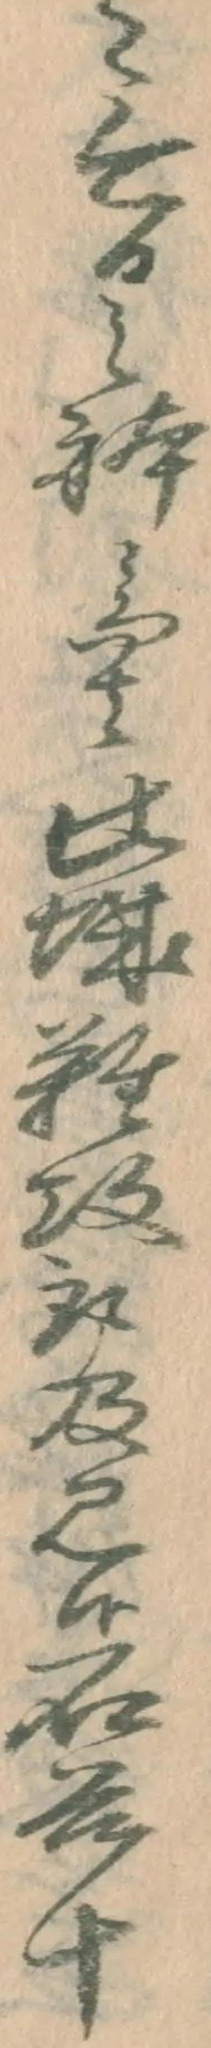々今日之躰に而者此城難攻取及見候石谷十
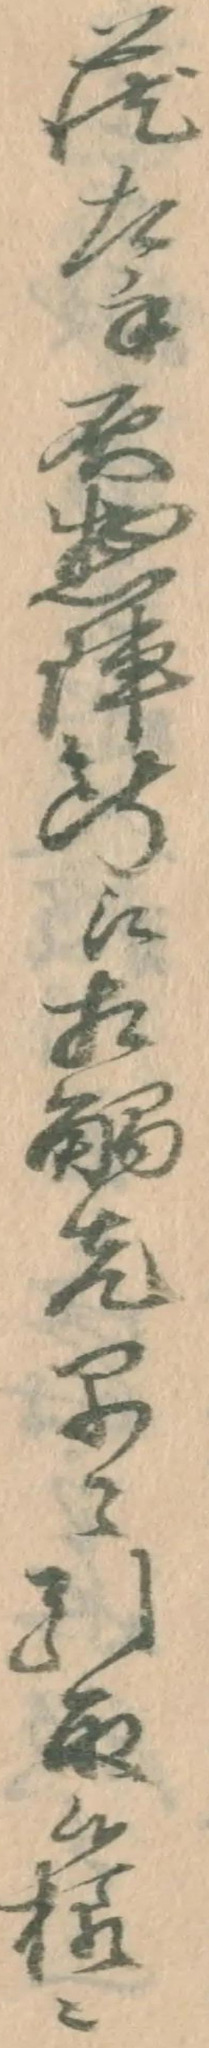蔵左手負惣陣所江相觸先早々引取候様に

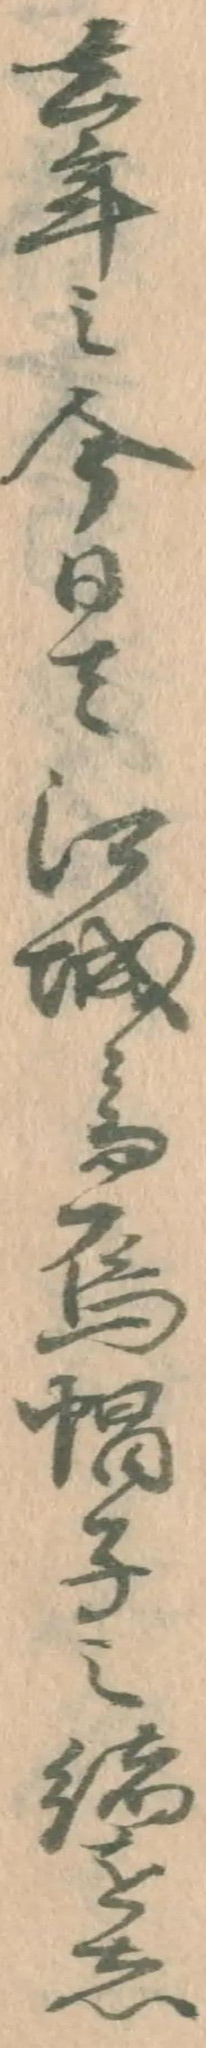去年之今日者江城に而烏帽子之緒を志
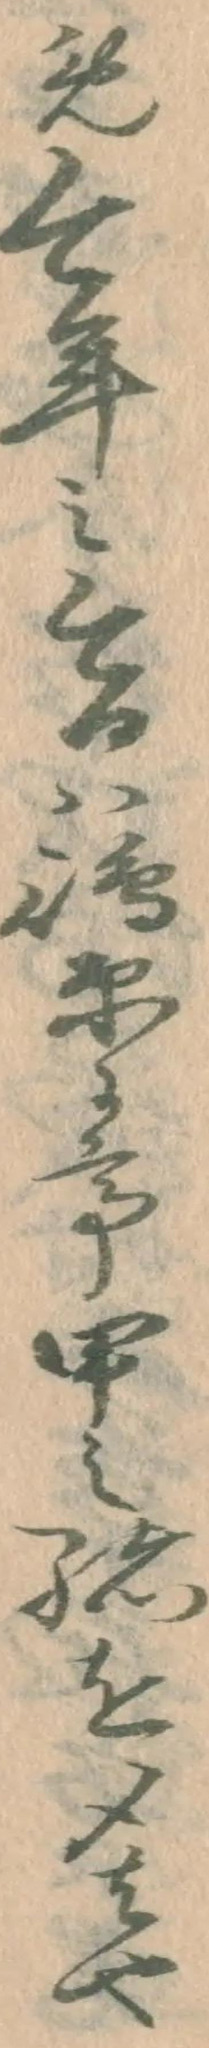免今年之今日は島原尓亭甲之緒を〆者や
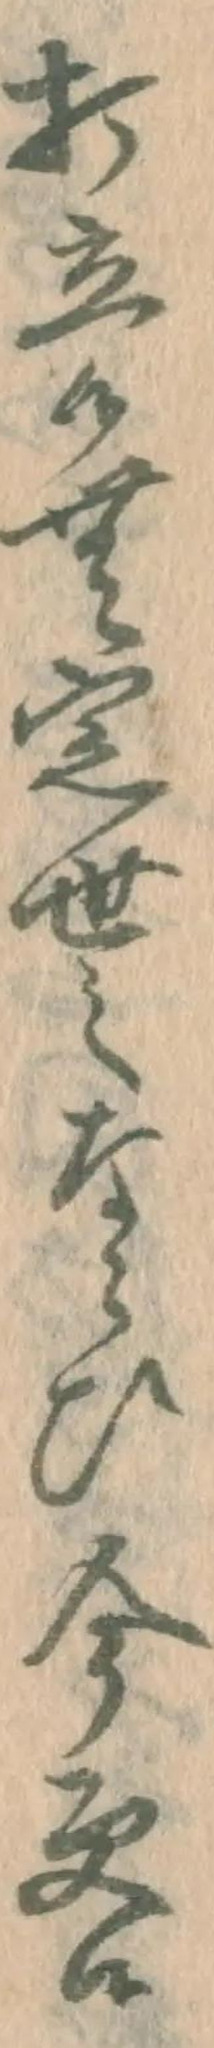打立候無定世之ならひ今更候
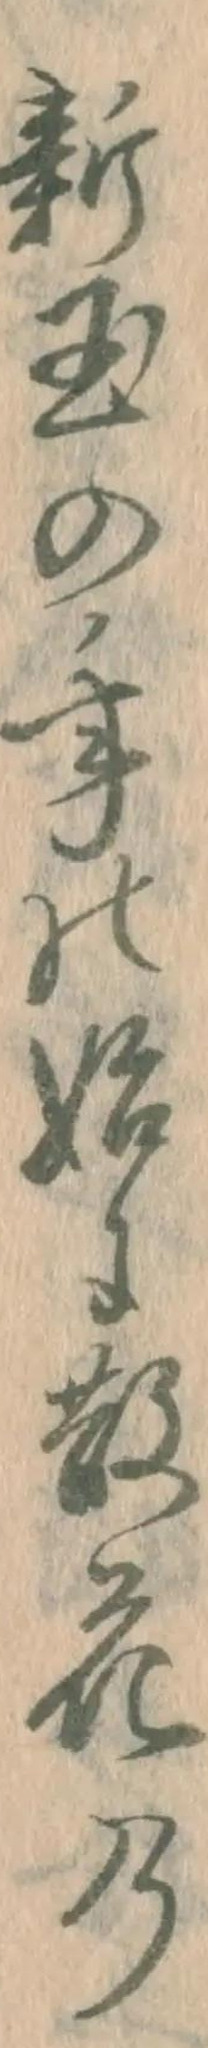新玉の年能始尓散花乃
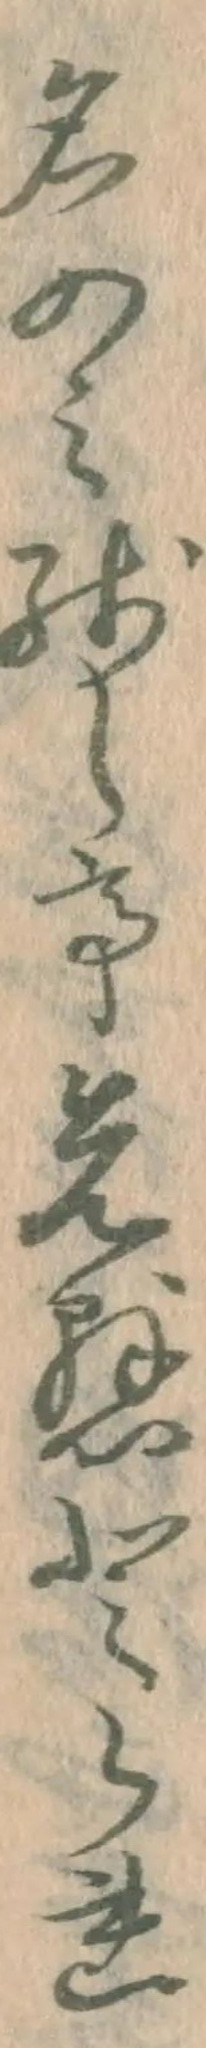名のみ残し亭先懸登ら連
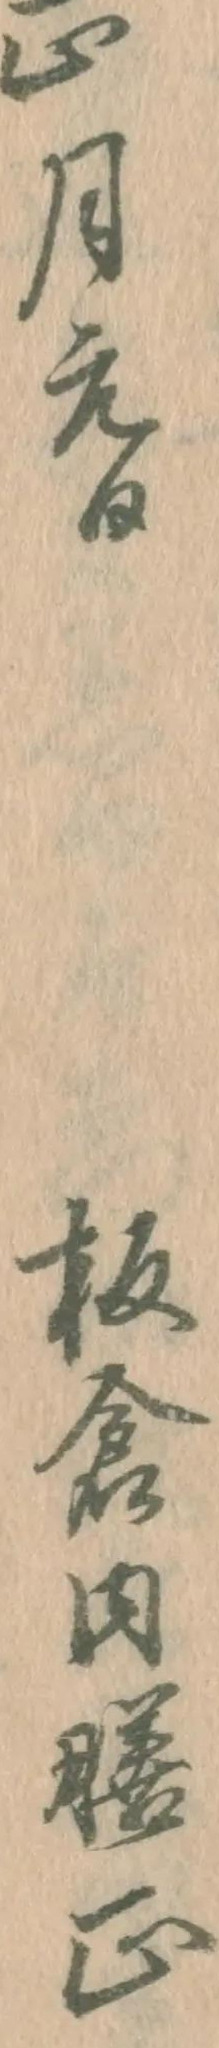正月元日板倉内膳正
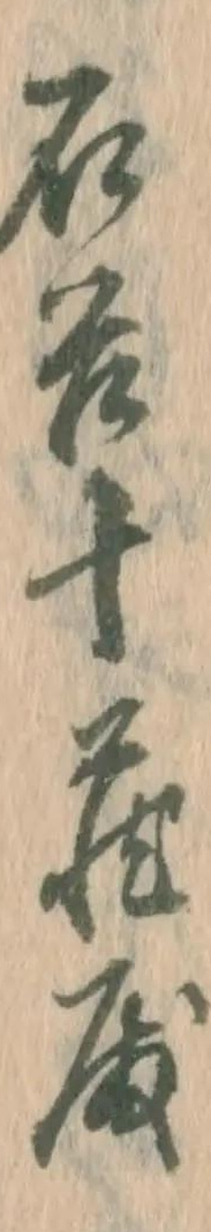石谷十蔵殿
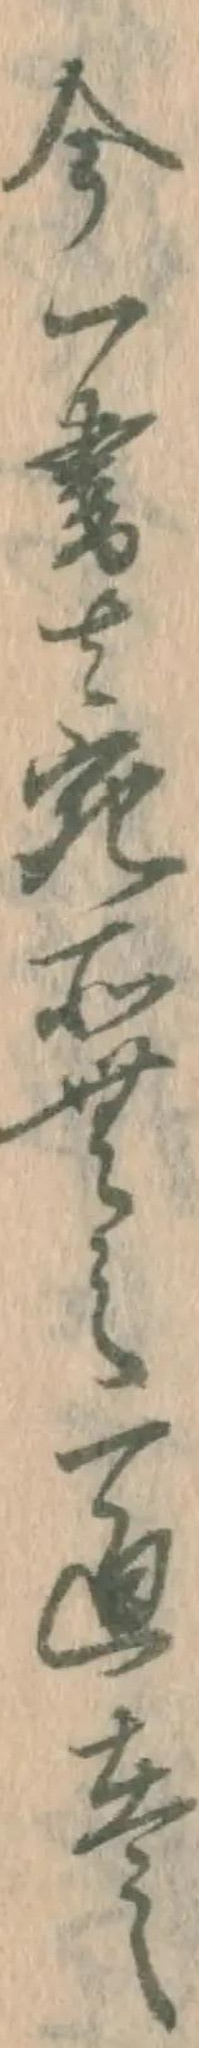今一書者宛所無之一通在之
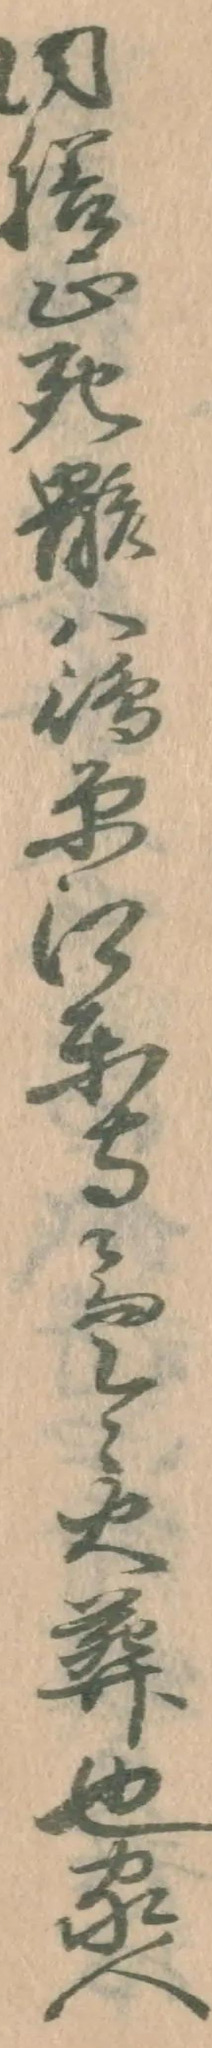内膳正死骸は島原江東寺に而令火葬也家人
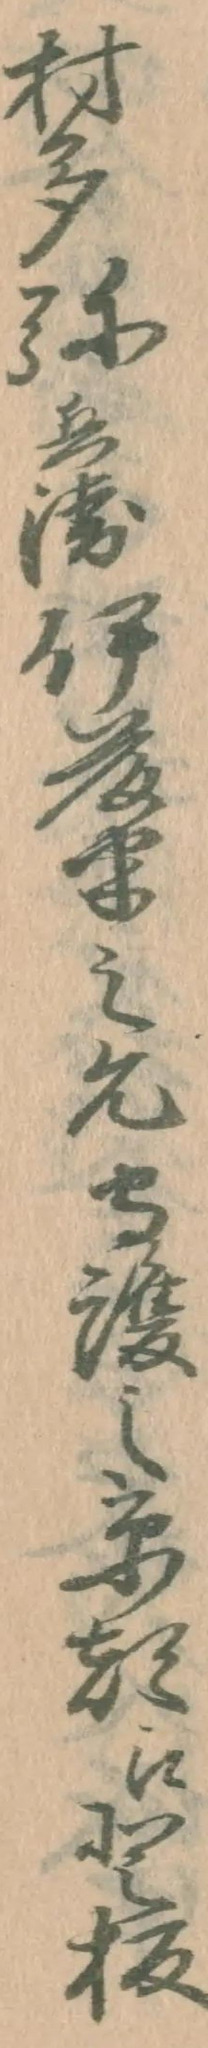村多弥兵衛伊藤半之允守護之京都江登板
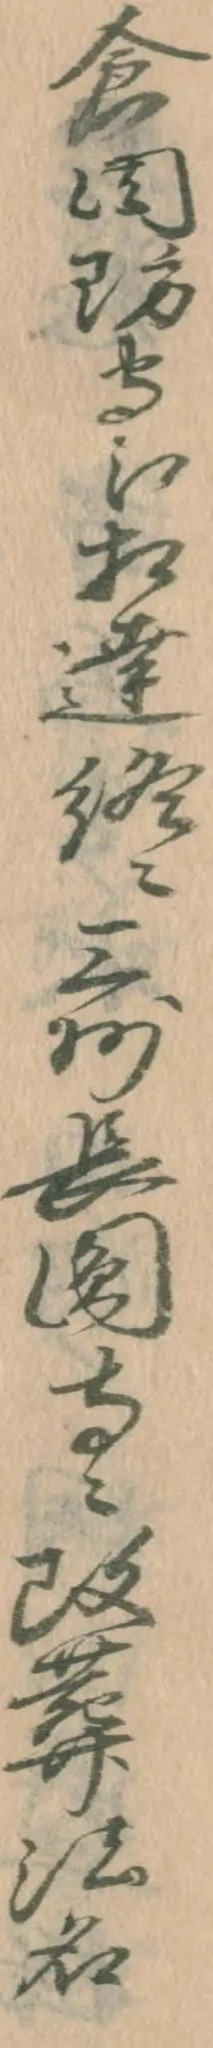倉周防守江相達終に三州長円寺に改葬法名
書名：切支丹御退治記 49巻. [5]
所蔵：国立国会図書館 National Diet Library, JAPAN
